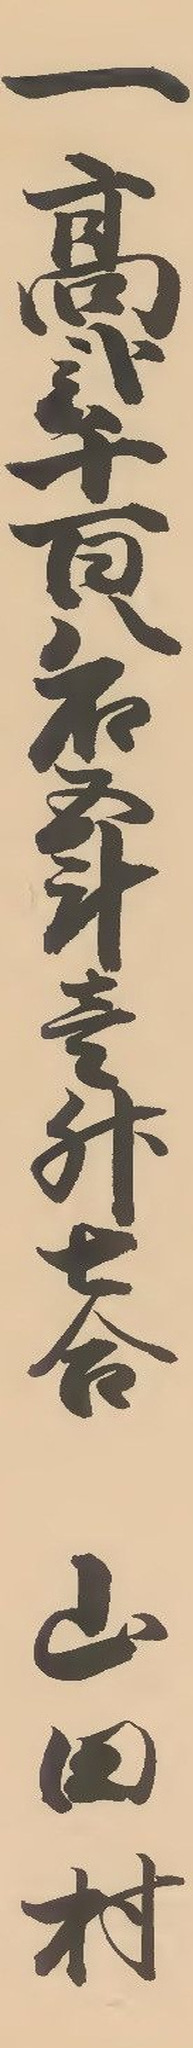一髙二千百八石五斗壱升七合山田村

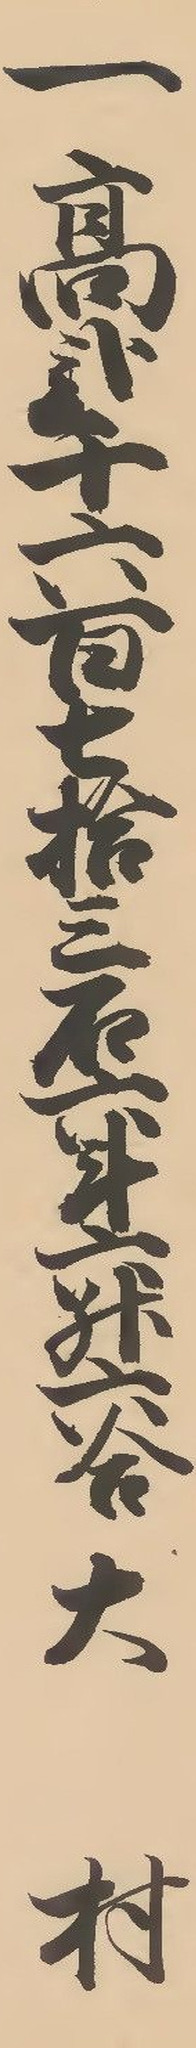一髙弐千六百七拾三石六斗六升六合大村
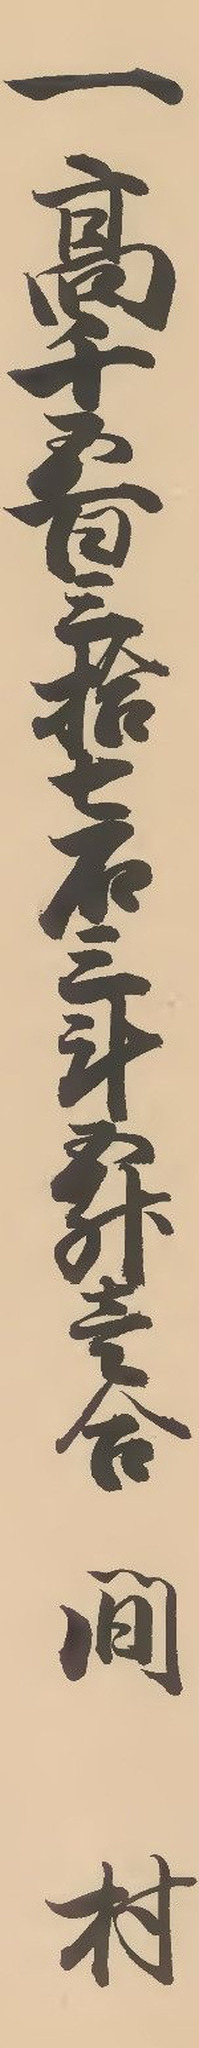一髙千五百三拾七石三斗五升壱合間村
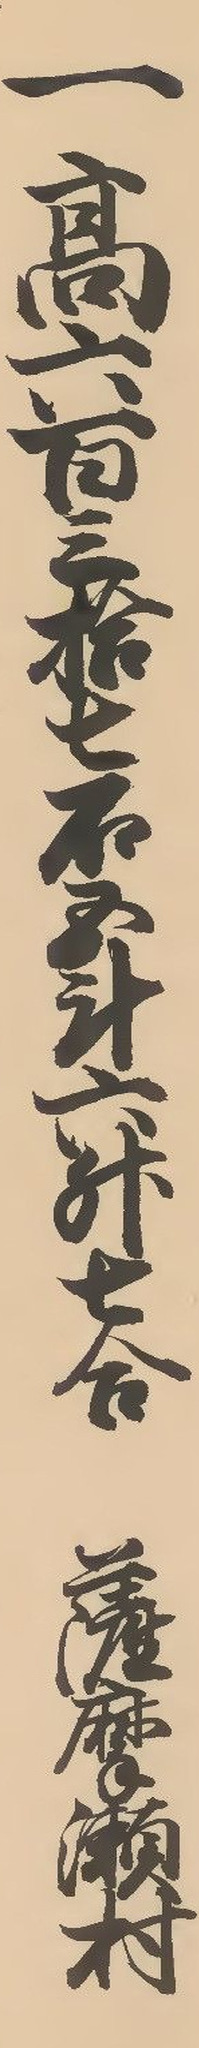一髙六百三拾七石五斗六升七合薩摩瀬村
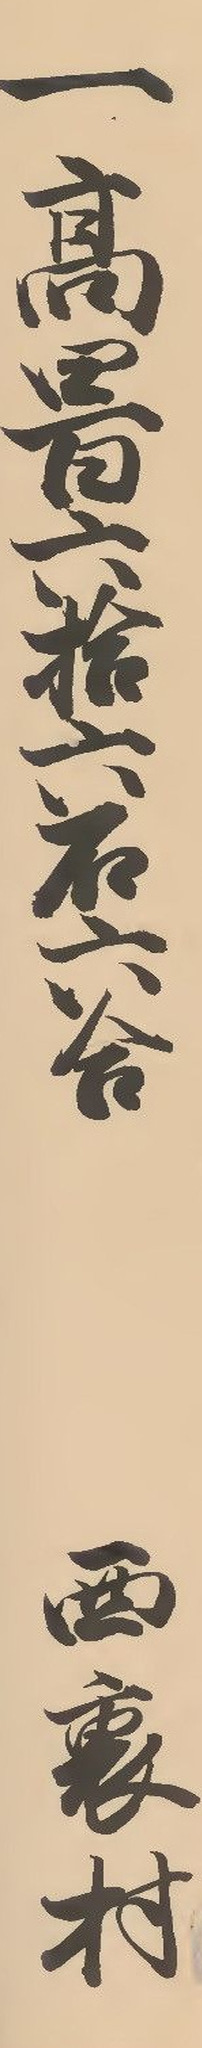一髙四百六拾六石六合西裏村
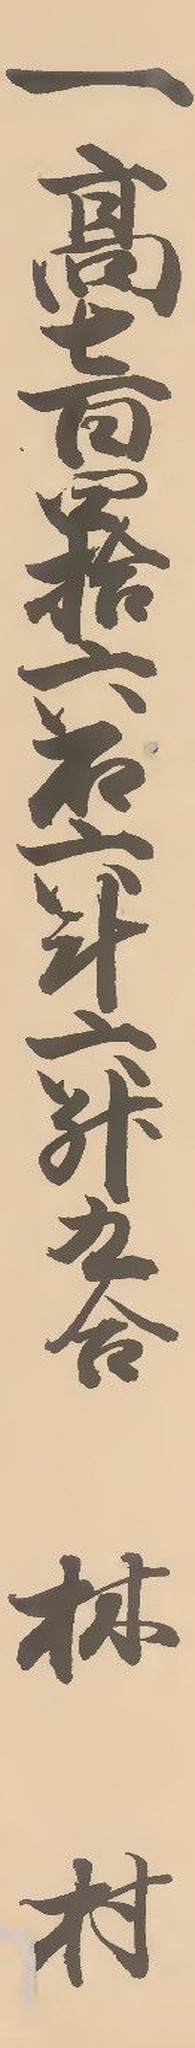一髙七百四拾六石六斗六升九合林村
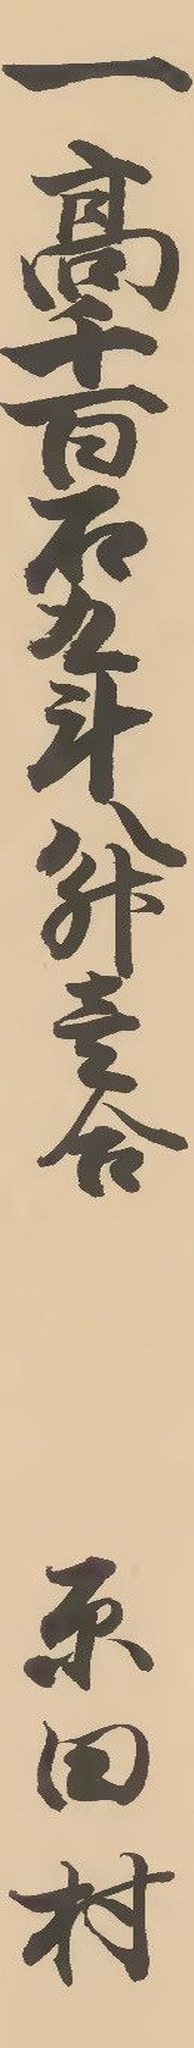一髙千百石九斗八升壱合原田村
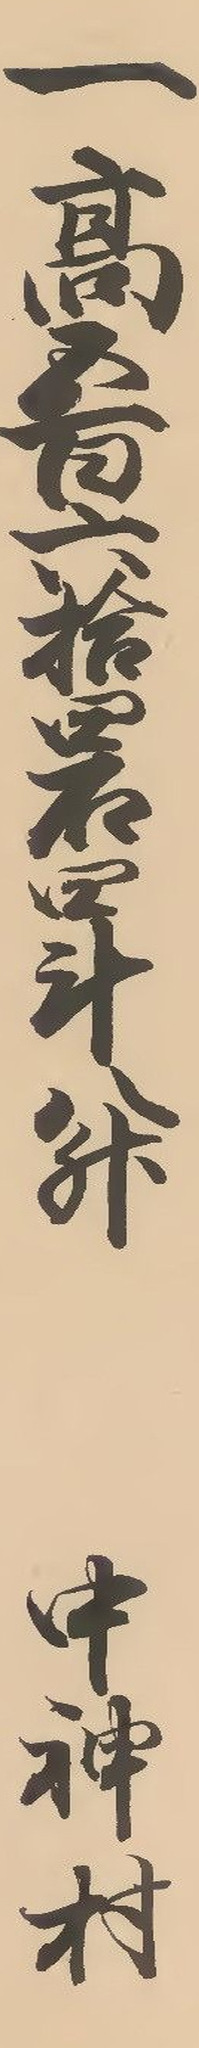一髙五百六拾四石四斗八升中神村
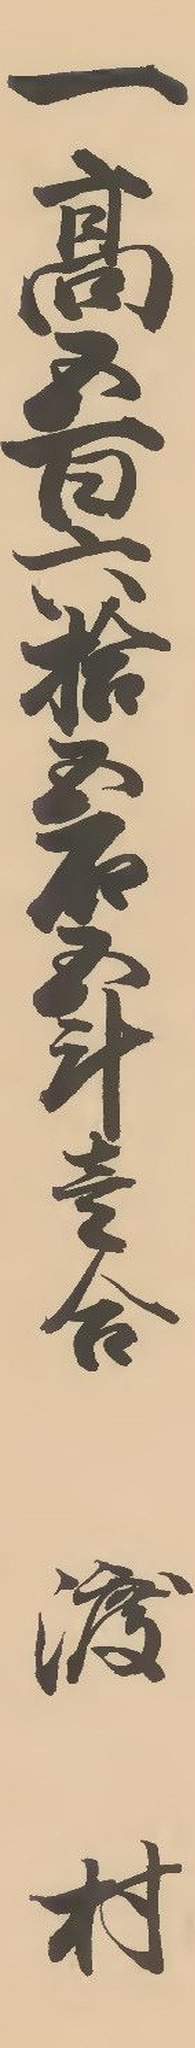一髙五百六拾五石五斗壱合渡村

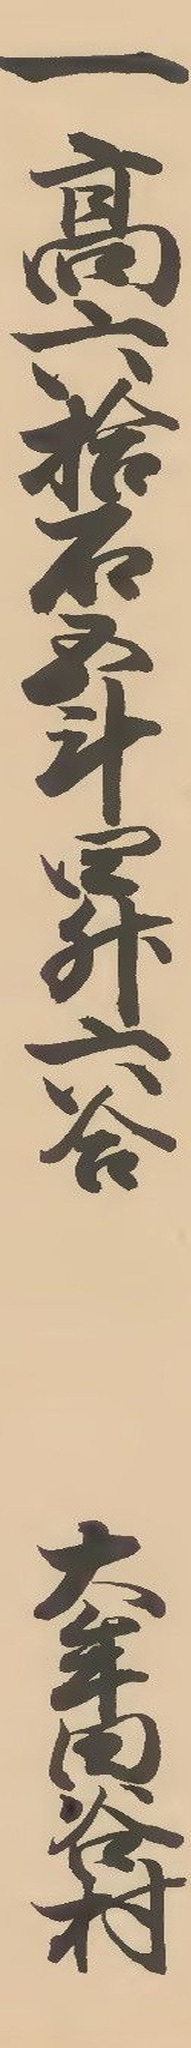一髙六拾石五斗四升六合大牟田谷村
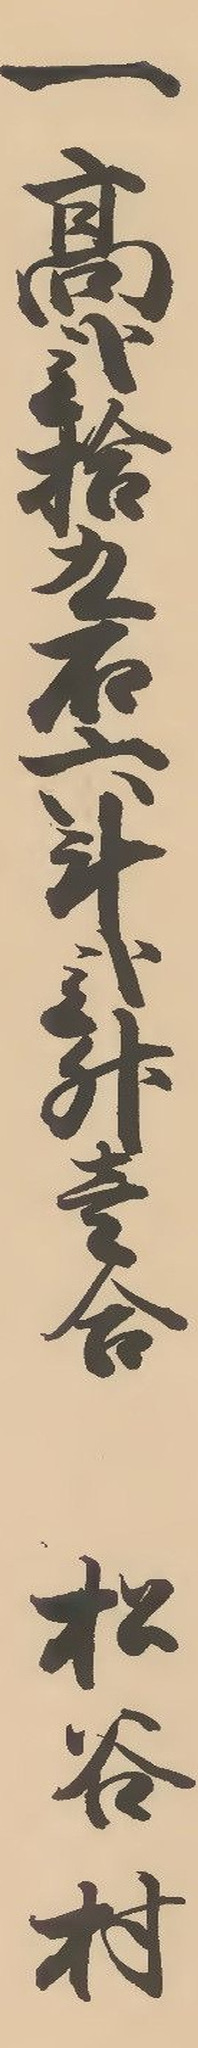一髙弐拾九石六斗弐升壱合松谷村
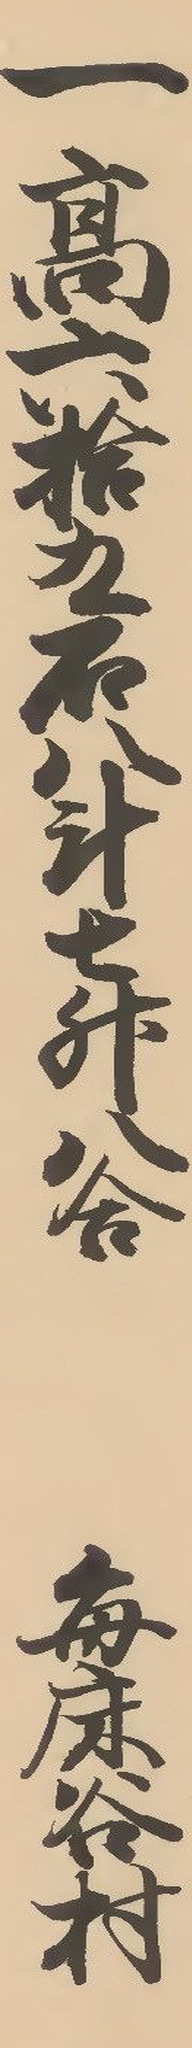一髙六拾九石八斗七升八合毎床谷村
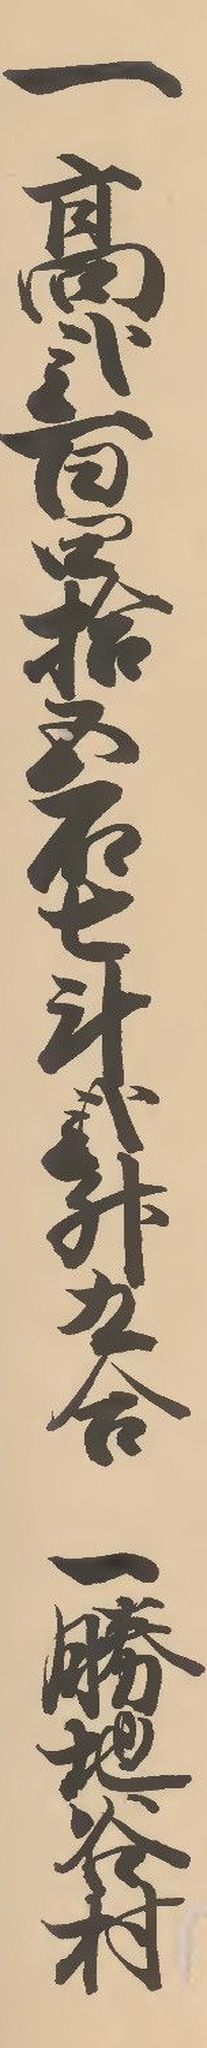一髙弐百四拾五石七斗弐升九合一勝地谷村
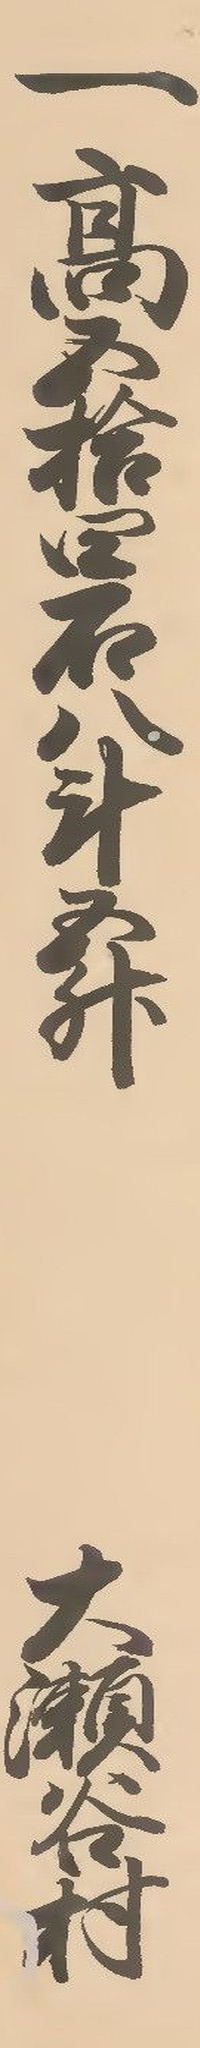一髙五拾四石八斗五升大瀬谷村
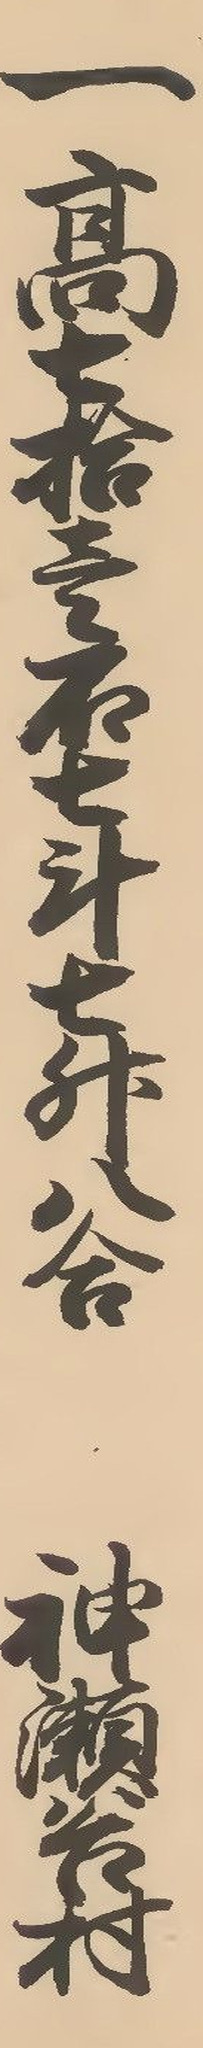一髙七拾壱石七斗七升八合神瀬谷村

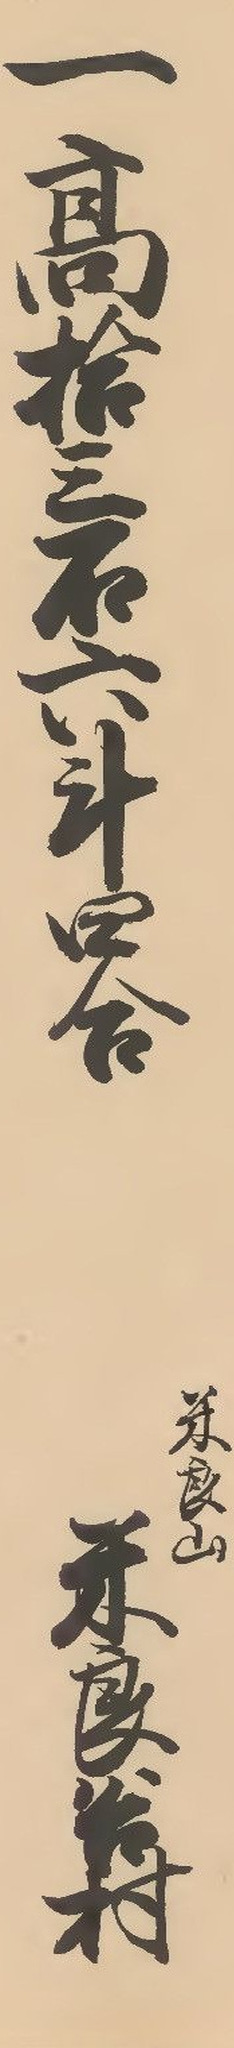一髙拾三石六斗四合米良谷村
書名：肥後国郷帳
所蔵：国立公文書館 National Archives of Japan
